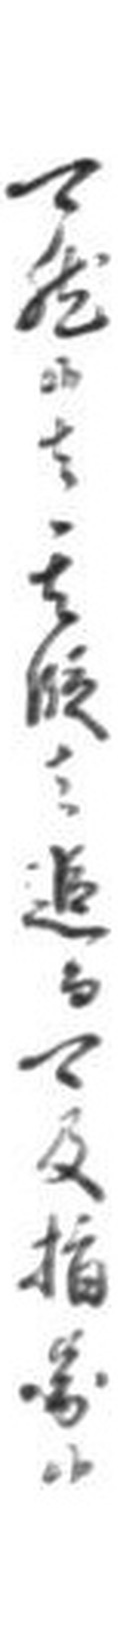可然候者其段者追而可及指図候
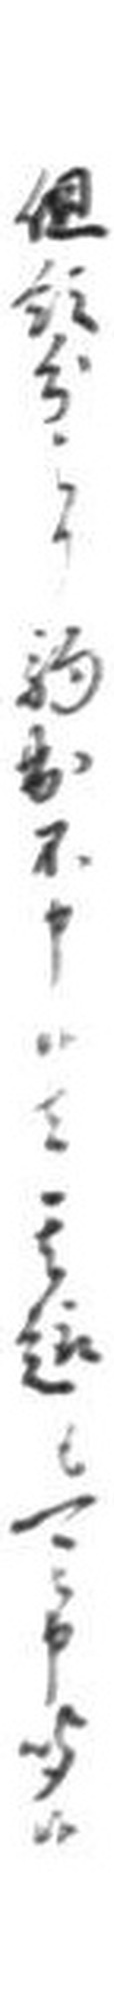但領分与り駒出不申候者其趣も可被申聞候

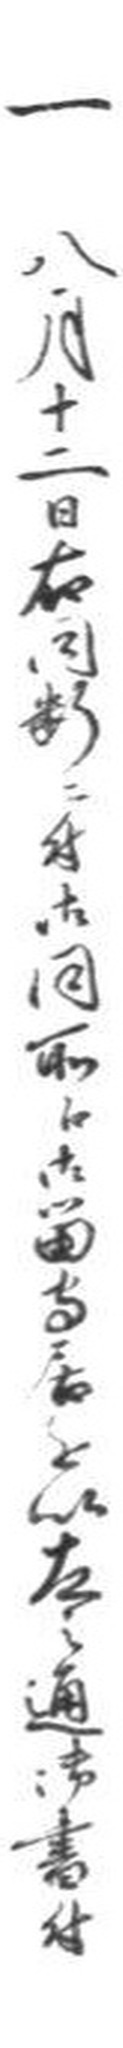一八月十二日右同断ニ付御同所江御留守居を以左之通御書付
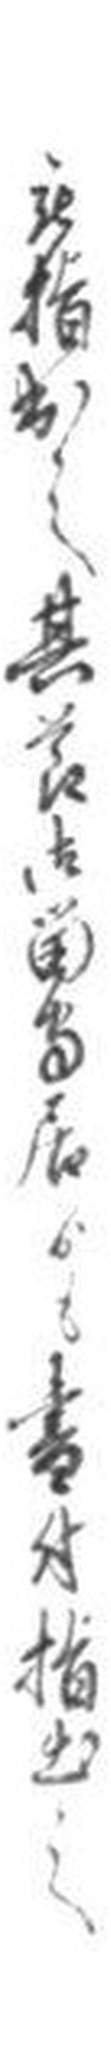被指出之其節御留守居ゟも書付指出之
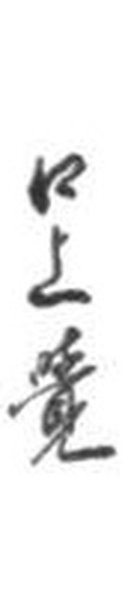口上覚
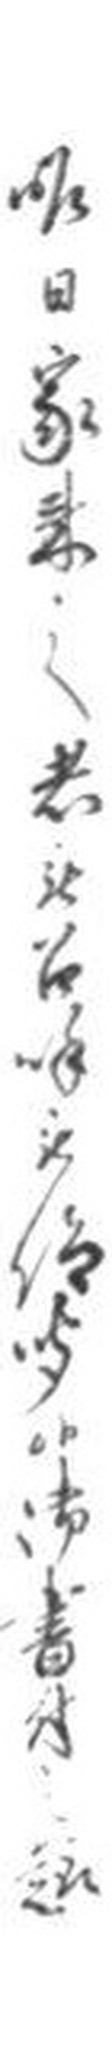昨日家来之者被召呼被仰聞候御書付之お趣
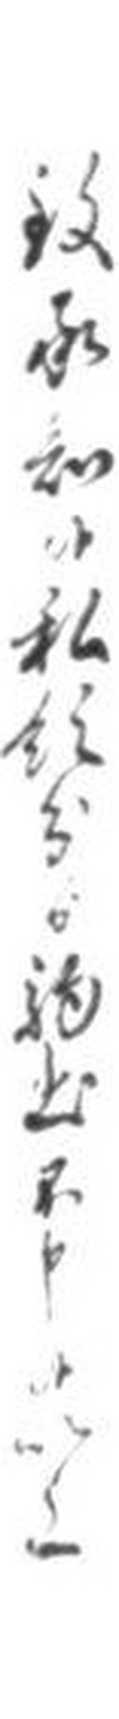致承知候私領分ゟ駒出不申候以上
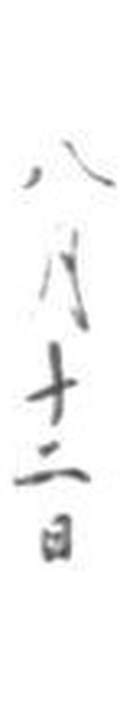八月十二日
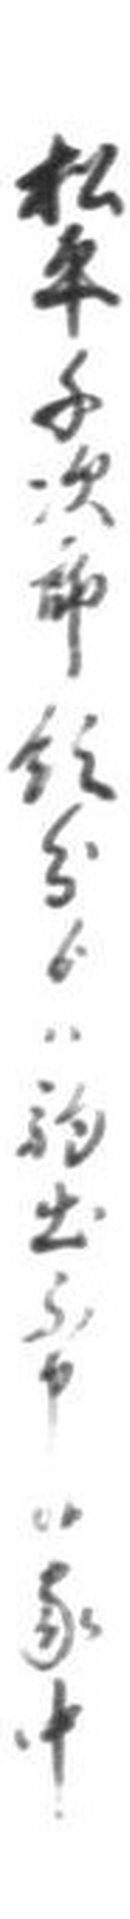松平千次郎領分ゟハ駒出不申候家中
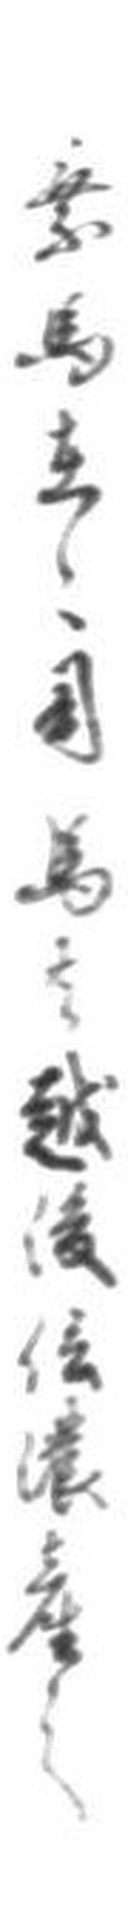乗馬在々用馬者越後信濃産之
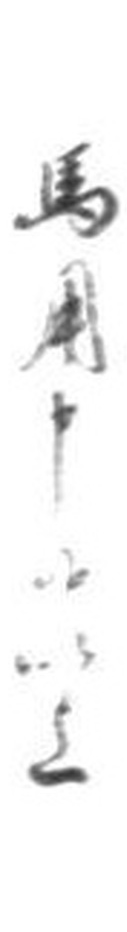馬用申候以上
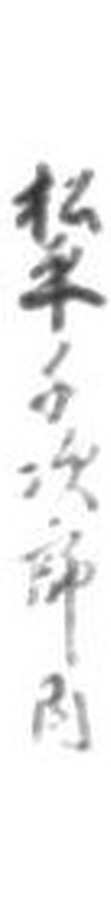松平千次郎内
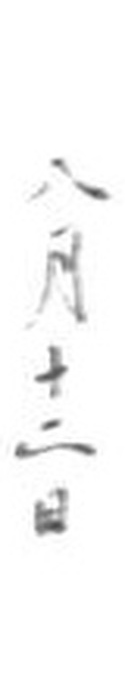八月十二日

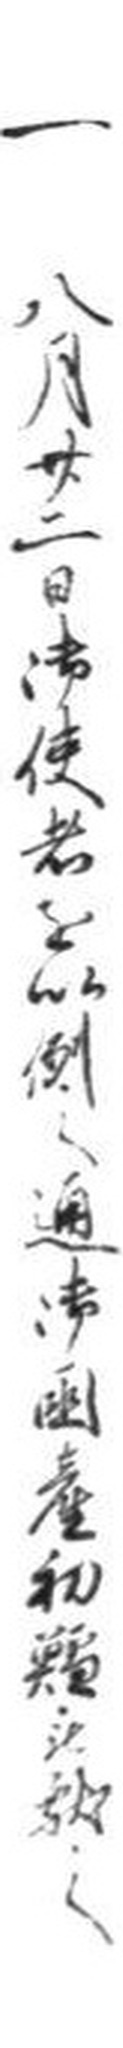一八月廿二日御使者を以例之通御国産初鱈被献之
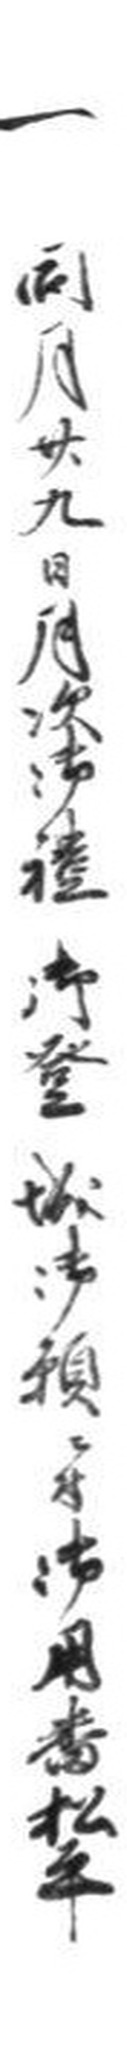一同月廿九日月次御礼御登城御願ニ付御用番松平
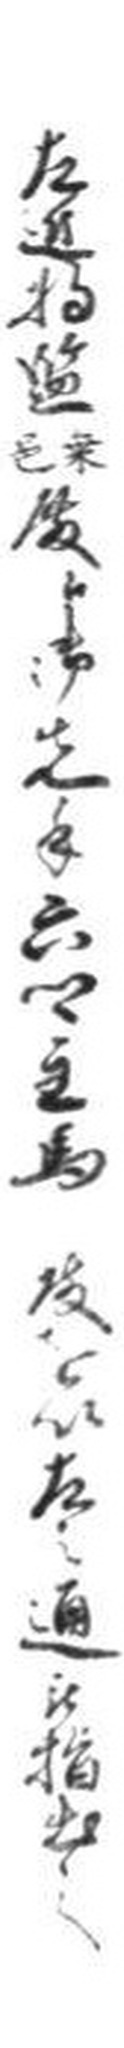左近将監乗邑殿江御先手六郷主馬殿を以願左之通被指出之
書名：家譜 四十 宗矩公 従享保十一年到享保十二年
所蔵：福井県文書館 Fukui Prefectural Archives
